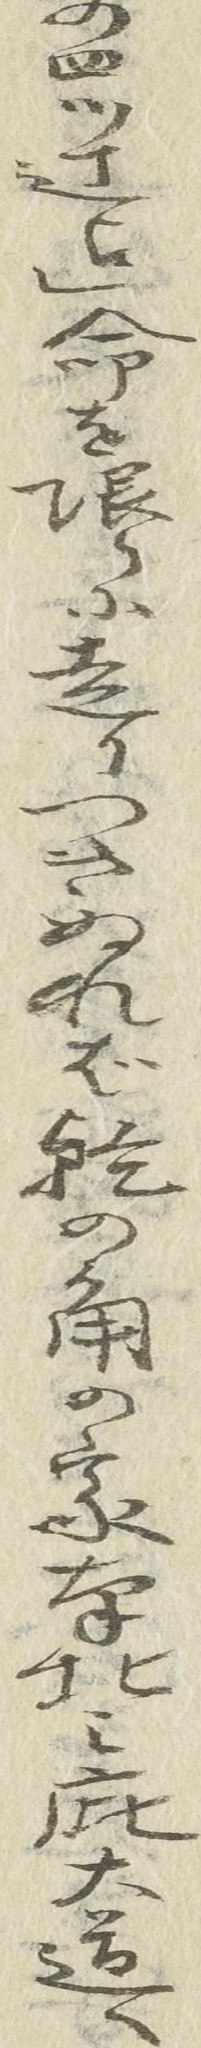の四ツ辻迄命を限りに走りつきぬれば乾の角の家南北之庇大道へ
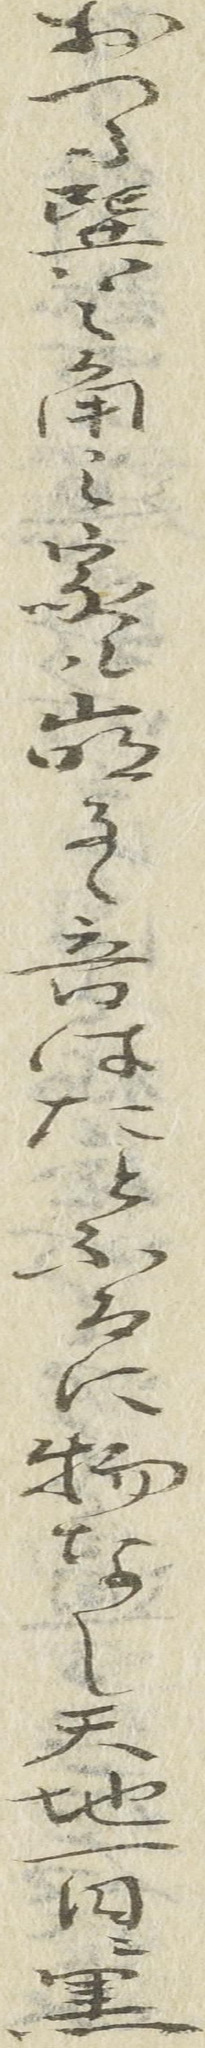おつる巽之角之家も崩るゝ音はたとふるに物なし天地一円ニ黒
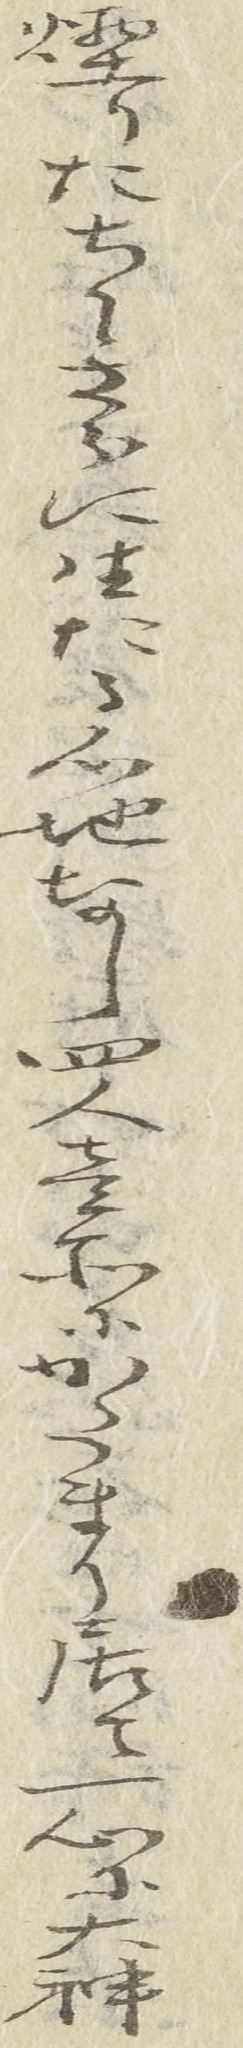煙りたちしさまに生たる心地なし四人壱所にからまり居て一心に大神
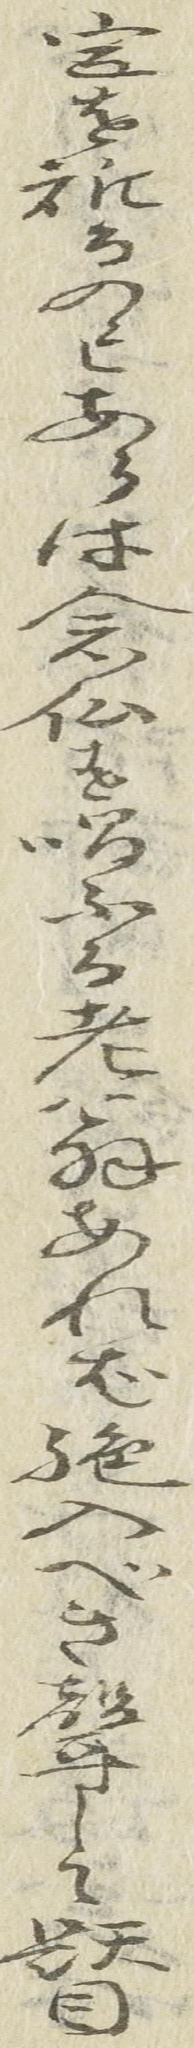宮を祈るのみあらは念仏を唱ふる老翁あれば絶入べき聲して題目
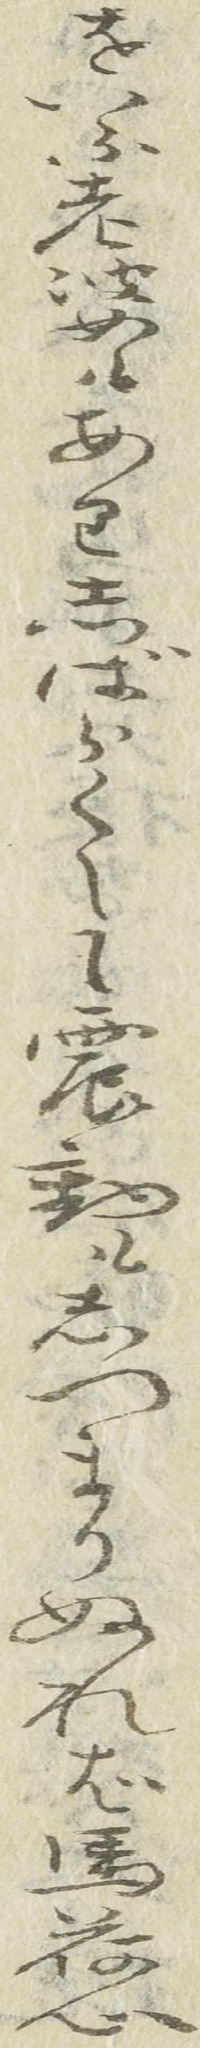をいふ老婆もありしばらくして震動もしつまりぬれば馬荷心
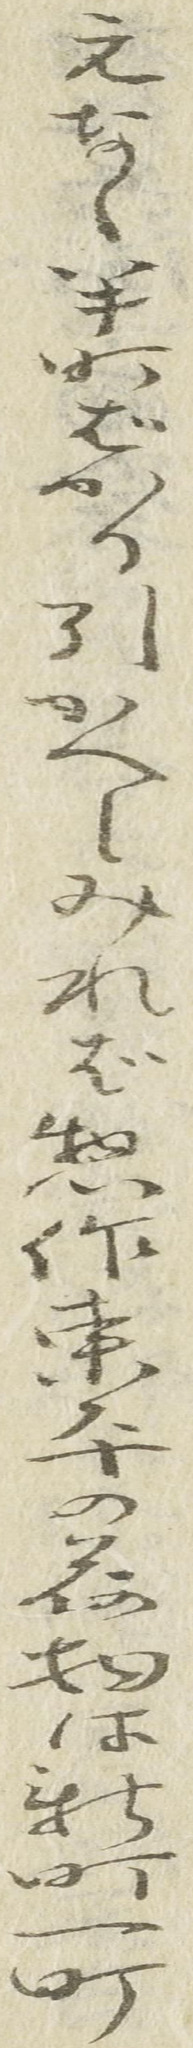えなく半町ばかり引かへしみれば惣作東平の荷物は新町一丁
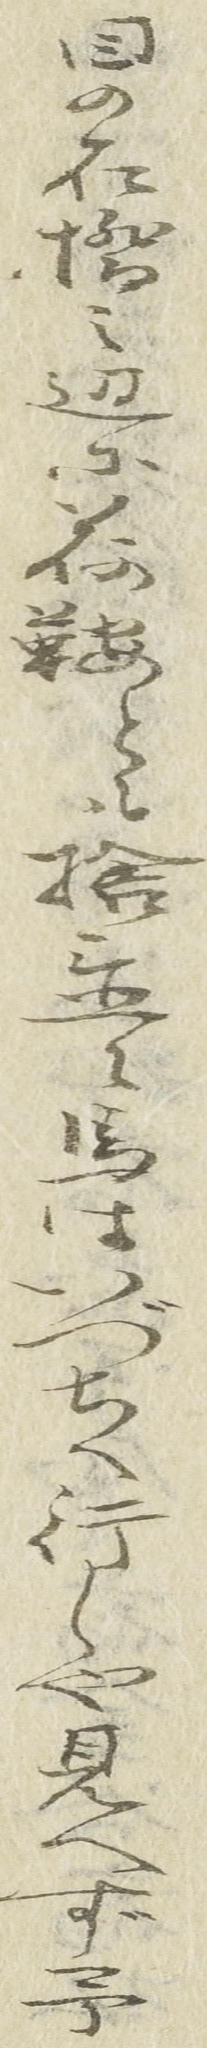目の石橋之辺に荷鞍とも捨置て馬はいづちへ行くや見へず予
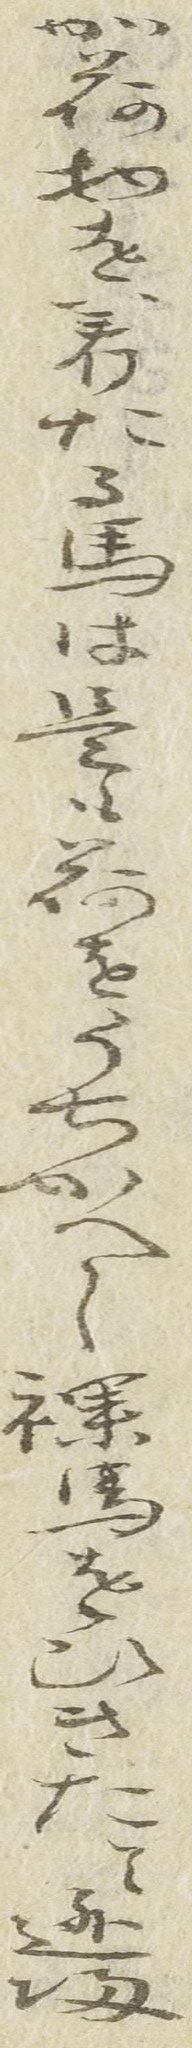が荷物を着たる馬は是も荷をうちかへし裸馬をひきたて逃帰
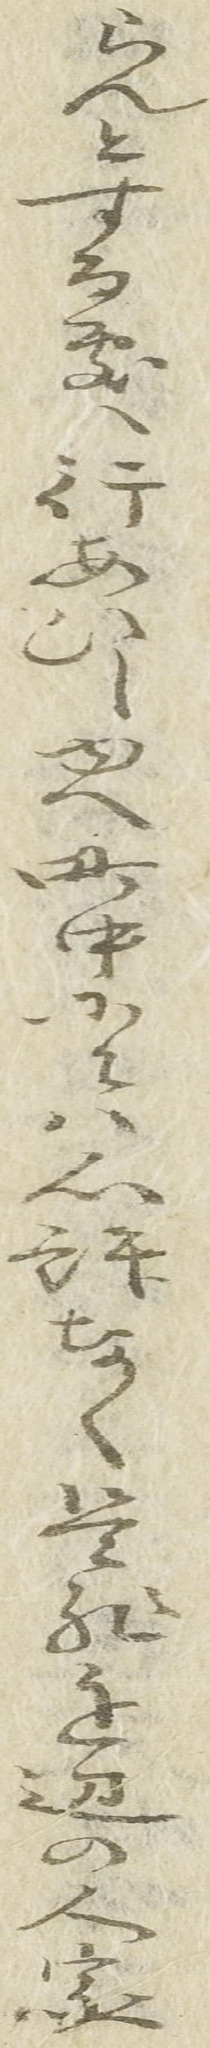らんとする處へ行あひしゆへ町中にてハ心許なく是然を辺の人家
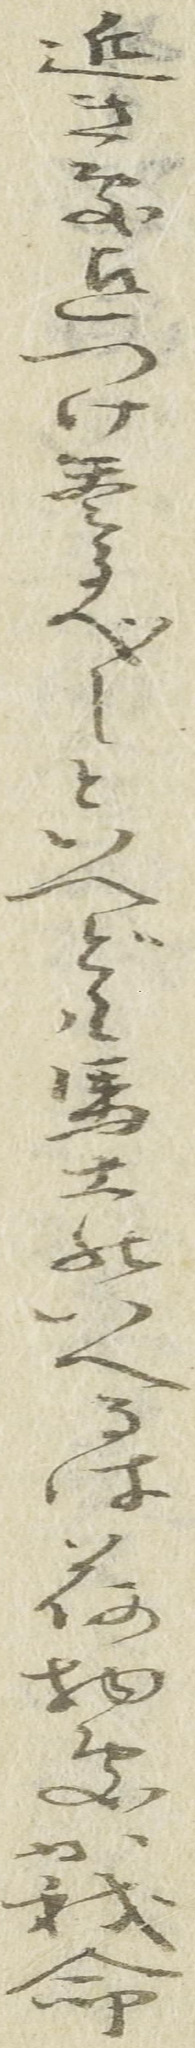近き處迄つけ参るべしといへども馬士のいへるは荷物處か我命
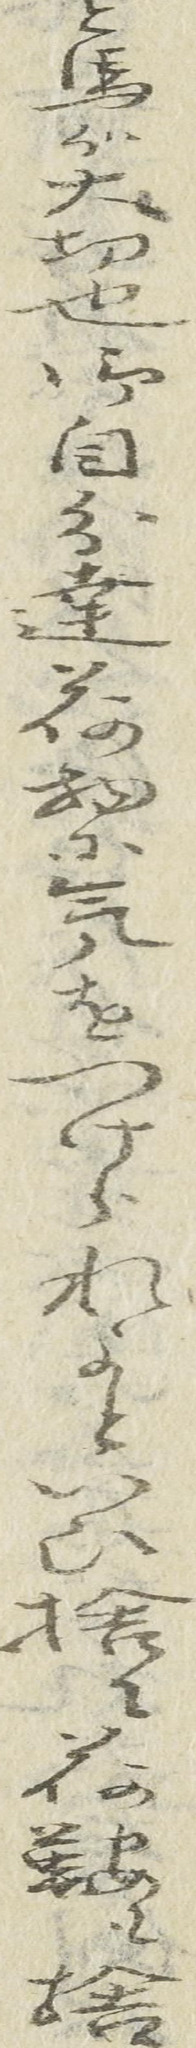と馬が大切也御自分達荷物に気をつけられよといひ捨て荷鞍も捨
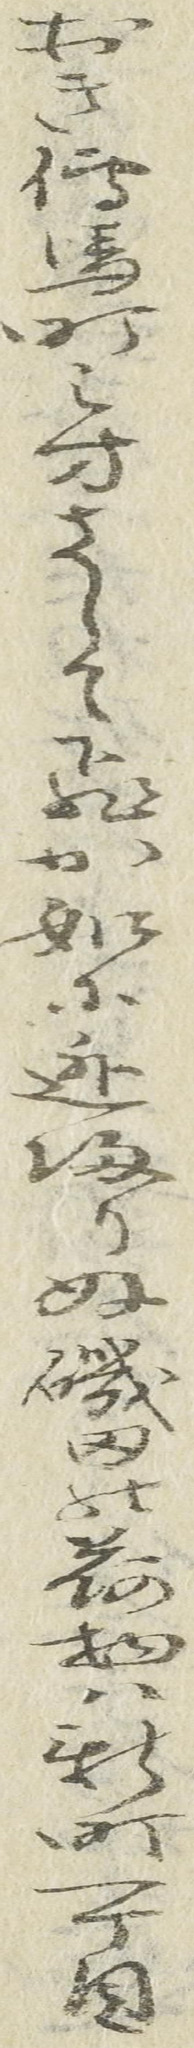おき伝馬町之方さして飛か如に逃帰りぬ磯田の荷物は新町一丁目
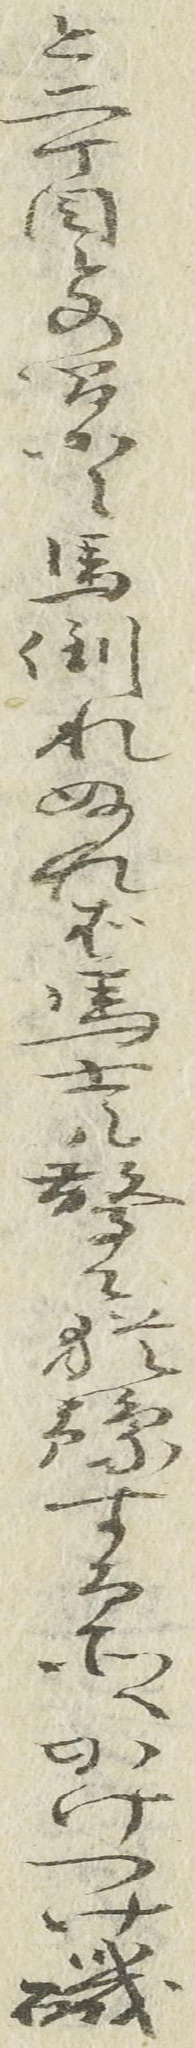と二丁目との間にて馬倒れぬれば馬士も驚て猶豫する所へかけつけ磯
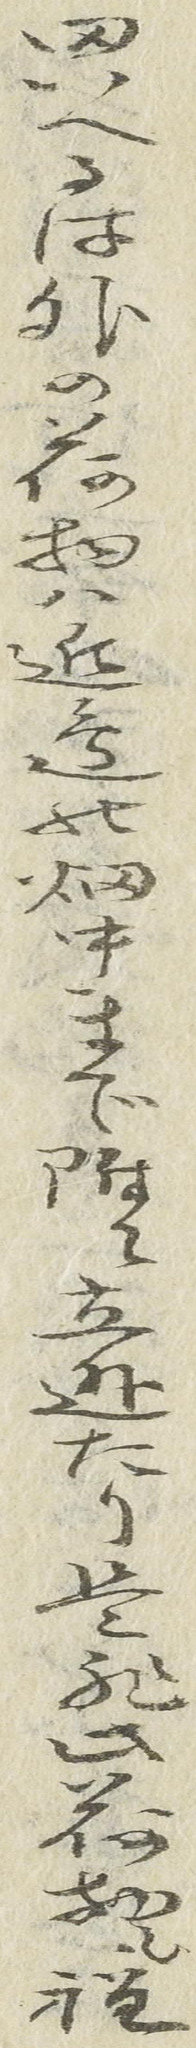田いへるは外の荷物は近邊の畑中まで附て立逃たり是然此荷物も程
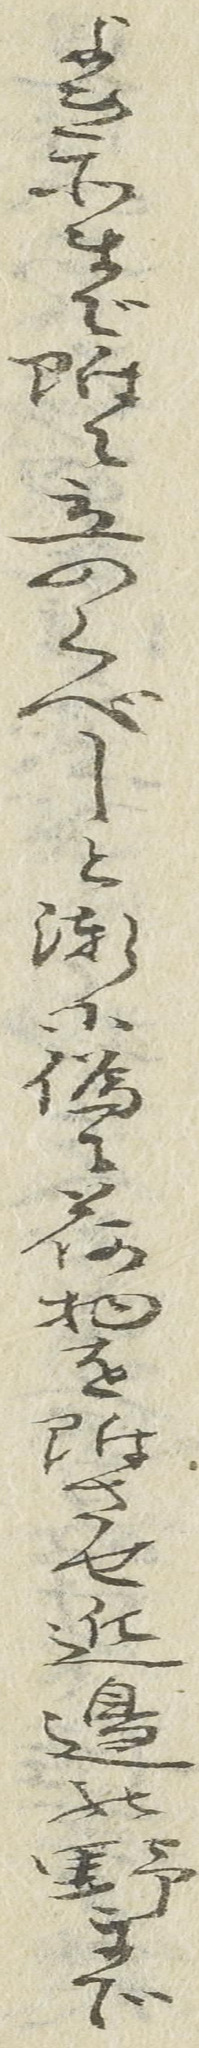よき所まで附て立のくべしと漸に偽て荷物を附させ近邊の野まで
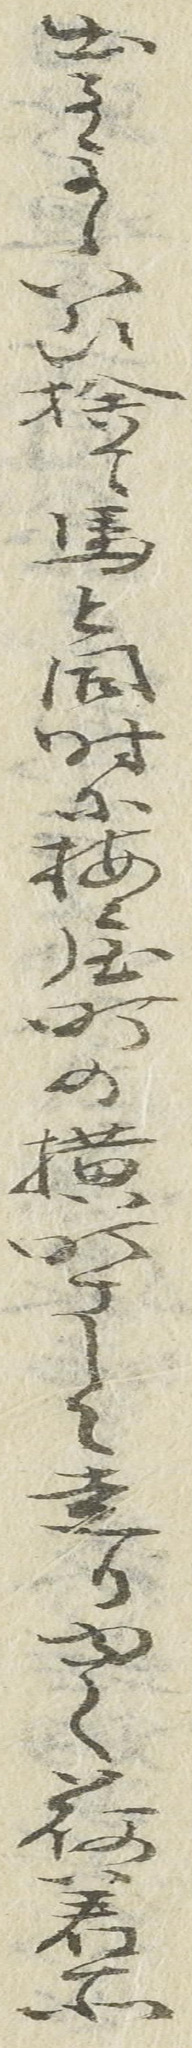出るよしいひ捨て馬と同時に梅屋町の横町さして走りゆく荷着所
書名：地震前兆集　全
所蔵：東京大学地震研究所図書室 Earthquake Research Institute Library, The University of Tokyo, JAPAN
